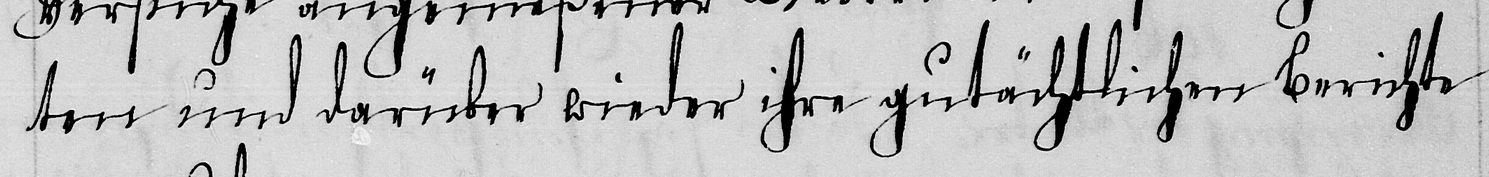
ten und darüber wieder ihre gutächtlichen Berichte
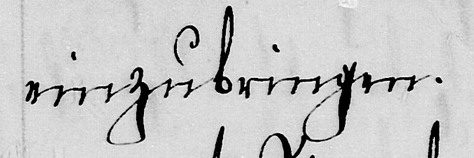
einzubringen.
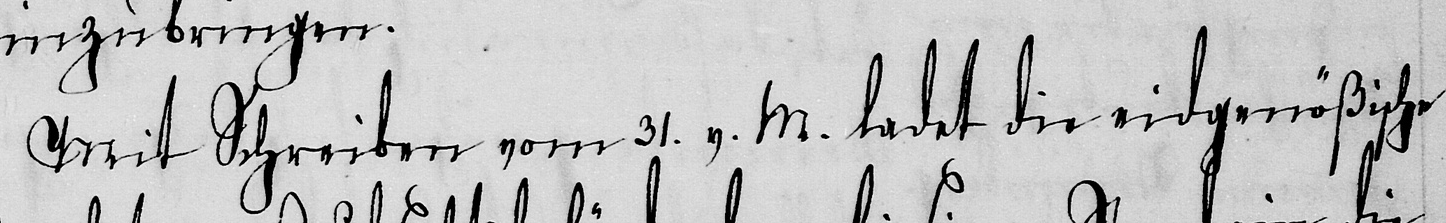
Mit Schreiben vom 31. v. M. ladet die eidgenößische
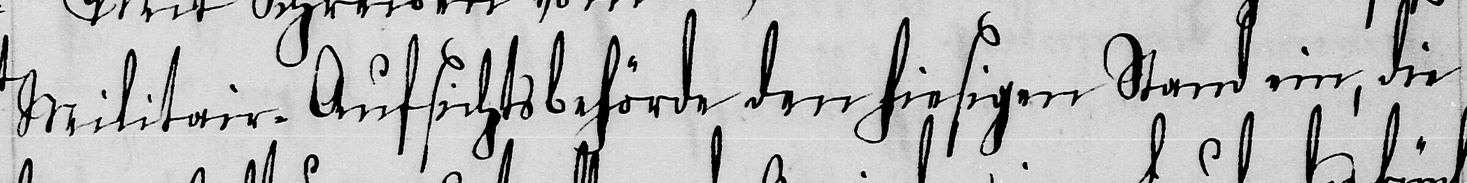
Militair-Aufsichtsbehörde den hiesigen Stand ein, die
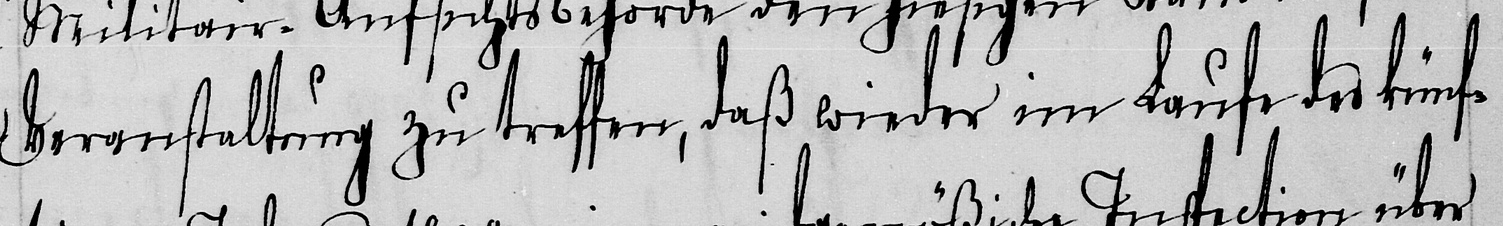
Veranstaltung zu treffen, daß wieder im Laufe des künf¬
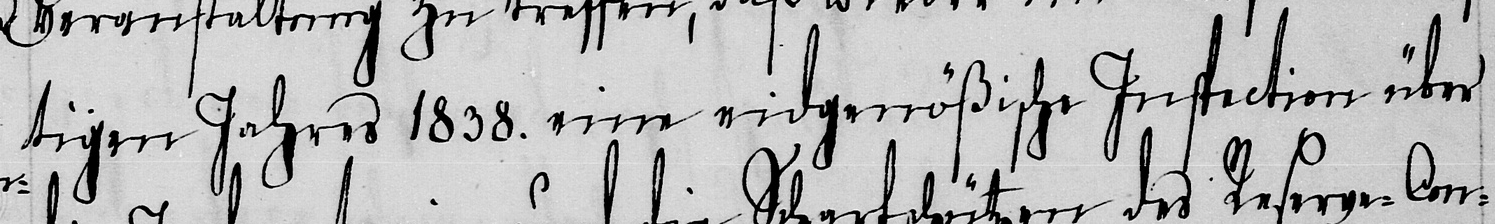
tigen Jahres 1838. eine eidgenößische Inspection über
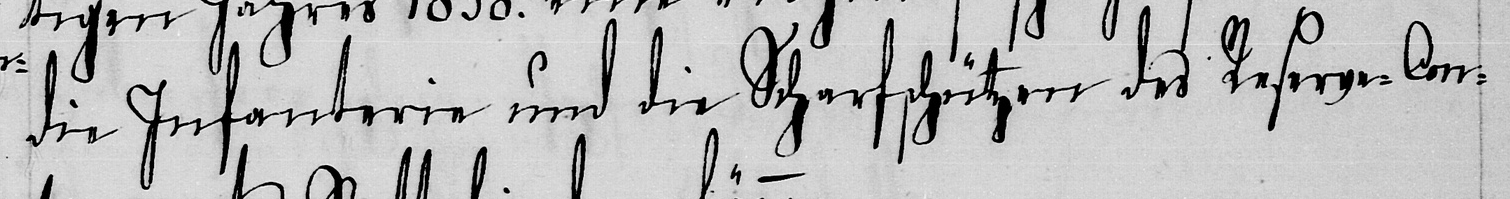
die Infanterie und die Scharfschützen des Reserve-Con¬
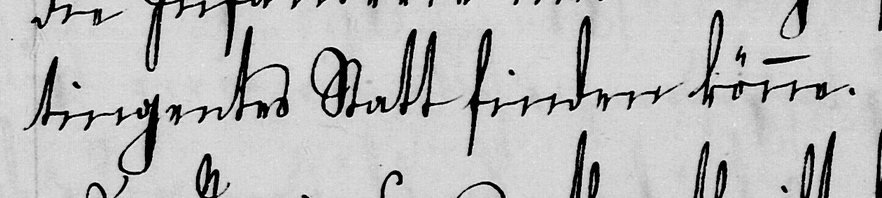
tingentes Statt finden könne.
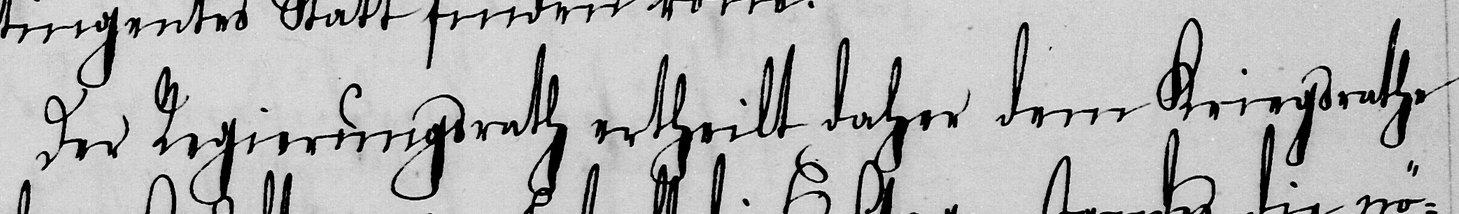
Der Regierungsrath ertheilt daher dem Kriegsrath
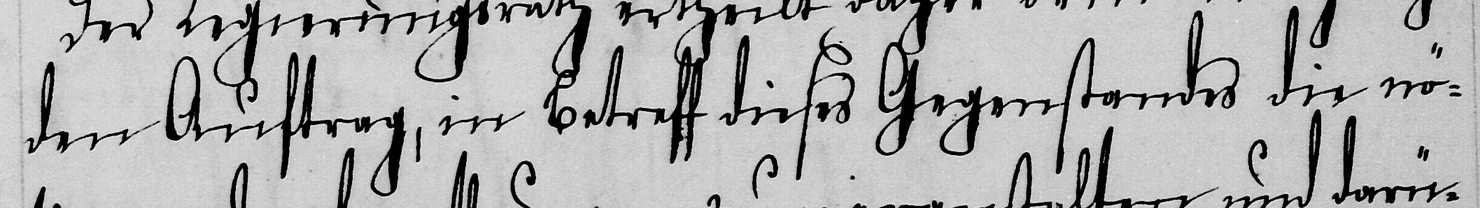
den Auftrag, in Betreff dieses Gegenstandes die nö¬
